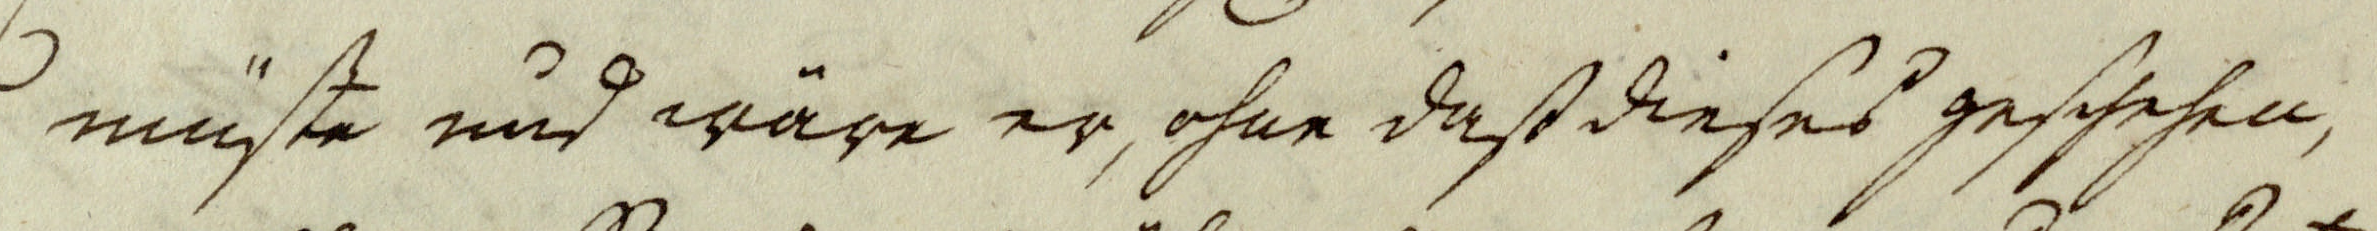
müsste und wäre er, ohne daß dieses geschehen,
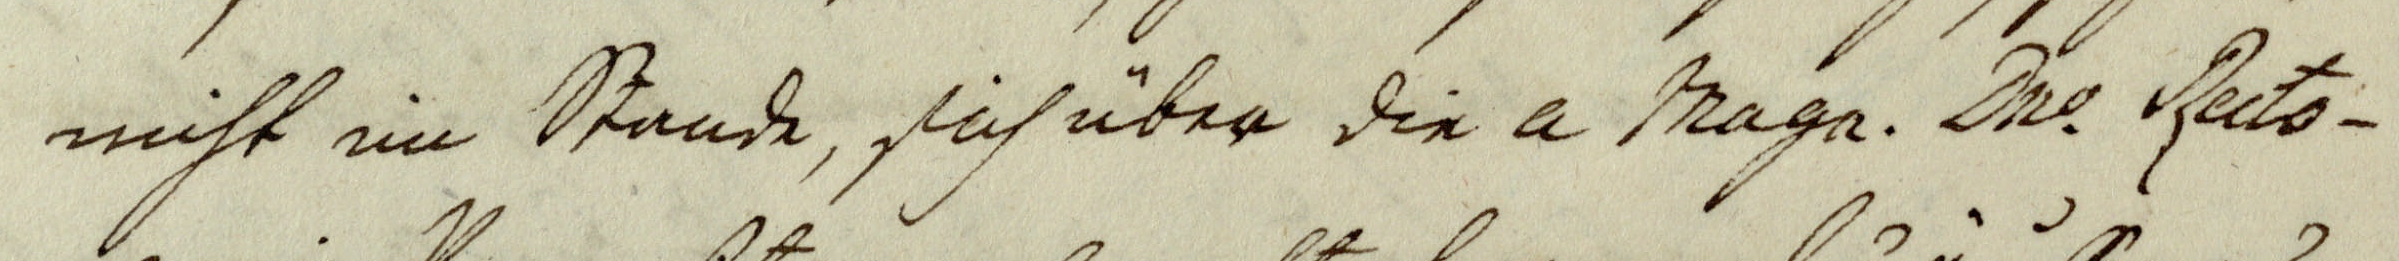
nicht im Stande, sich über die a Magn. Dno. Recto¬
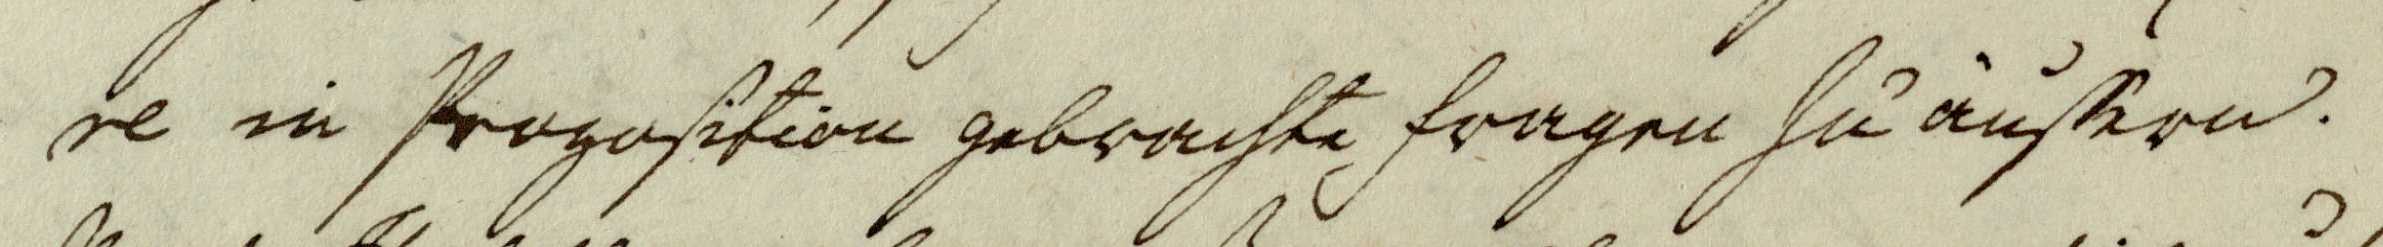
re in Proposition gebrachte Fragen zu äussern.
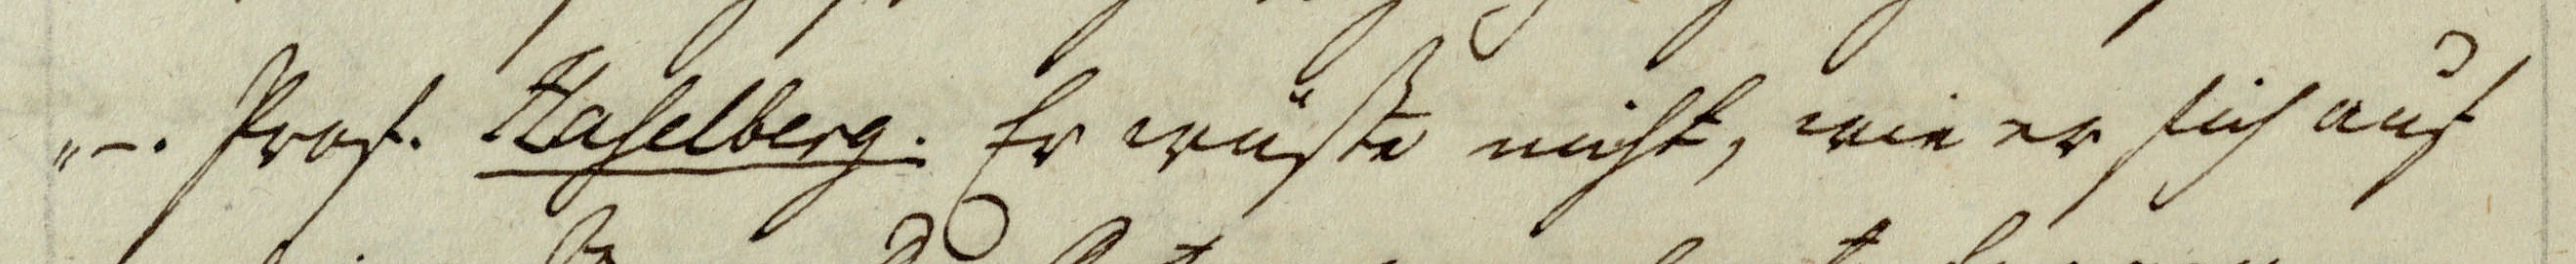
" — . Prof. Haselberg. Er wüsste nicht, wie er sich auf
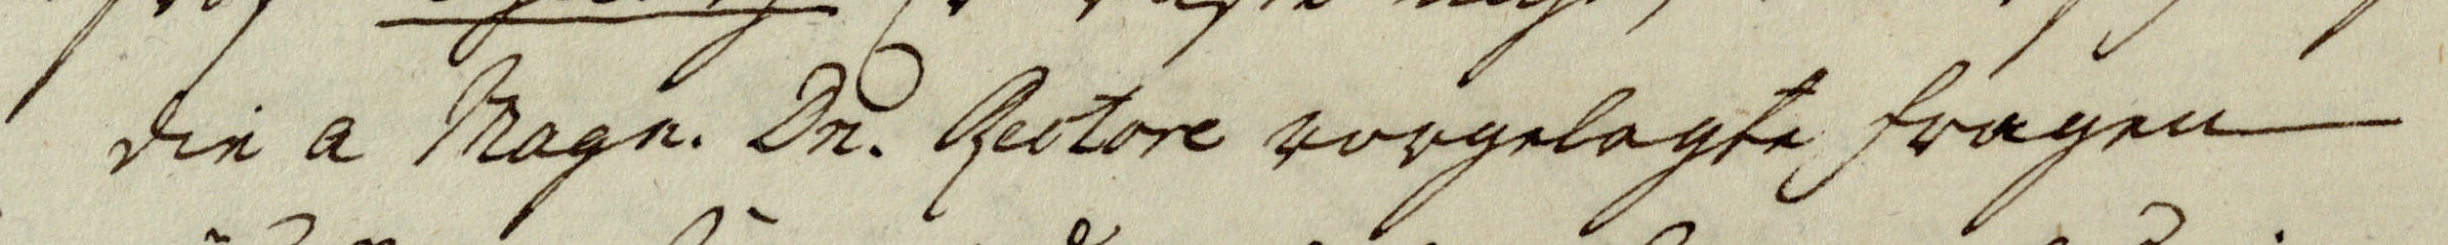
die a Magn. Dno. Rectore vorgelegte Fragen
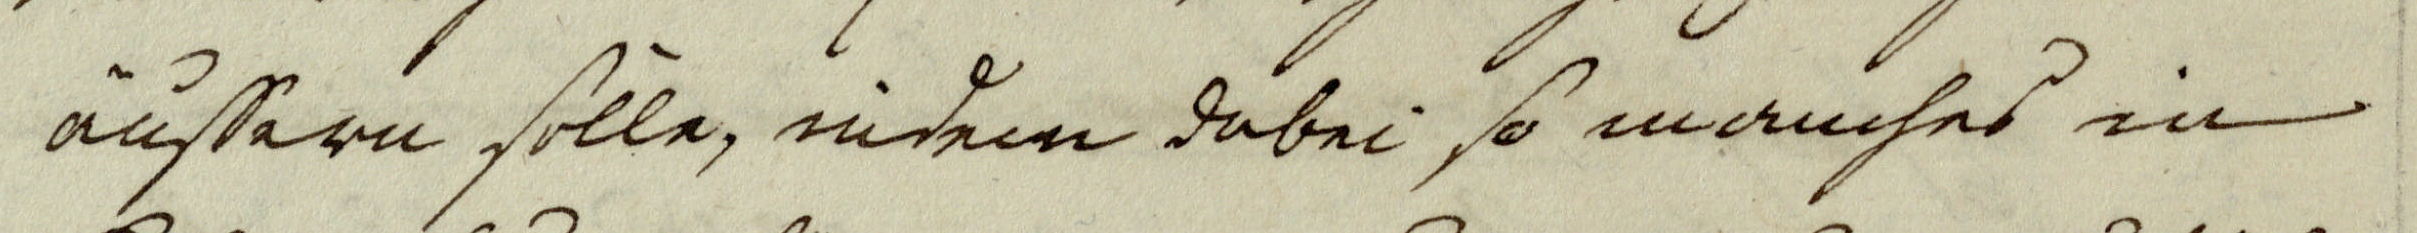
äussern solle, indem dabei so manches in
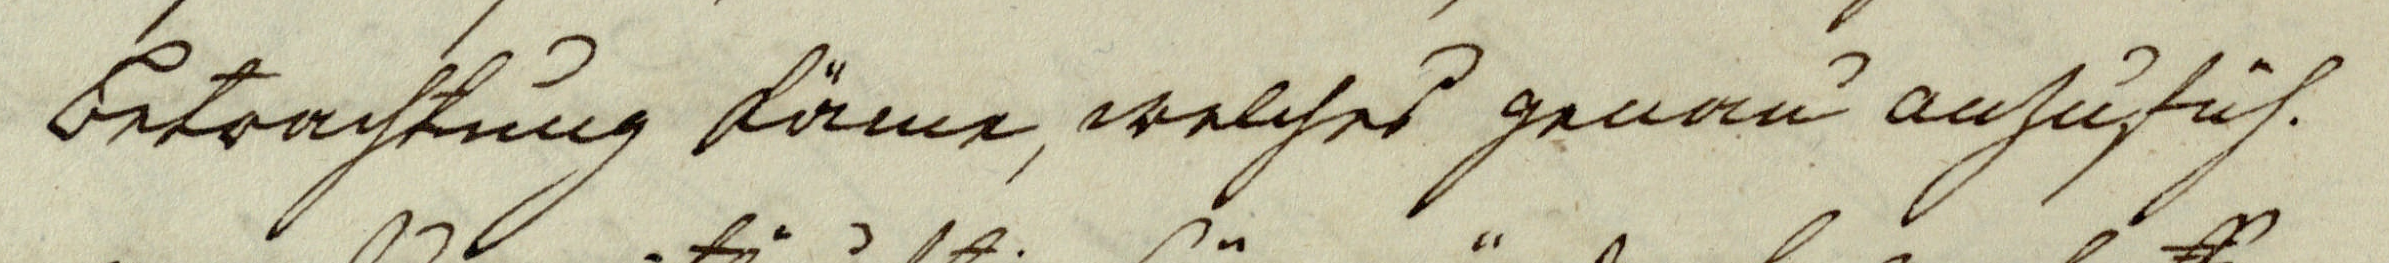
Betrachtung käme, welches genau anzufüh¬
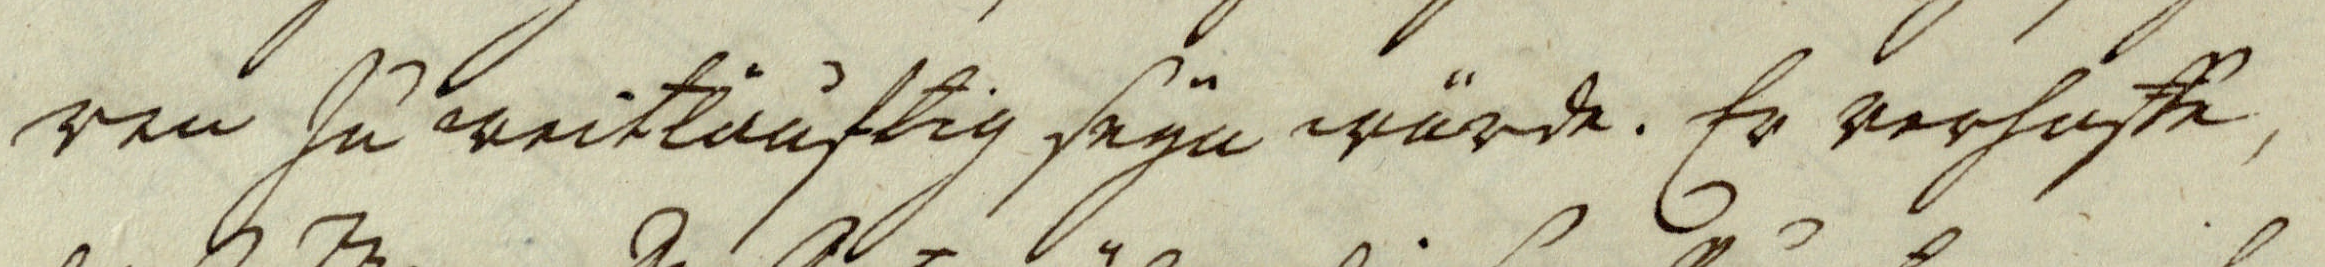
ren zu weitläuflig seÿn würde. Er verhoffe,
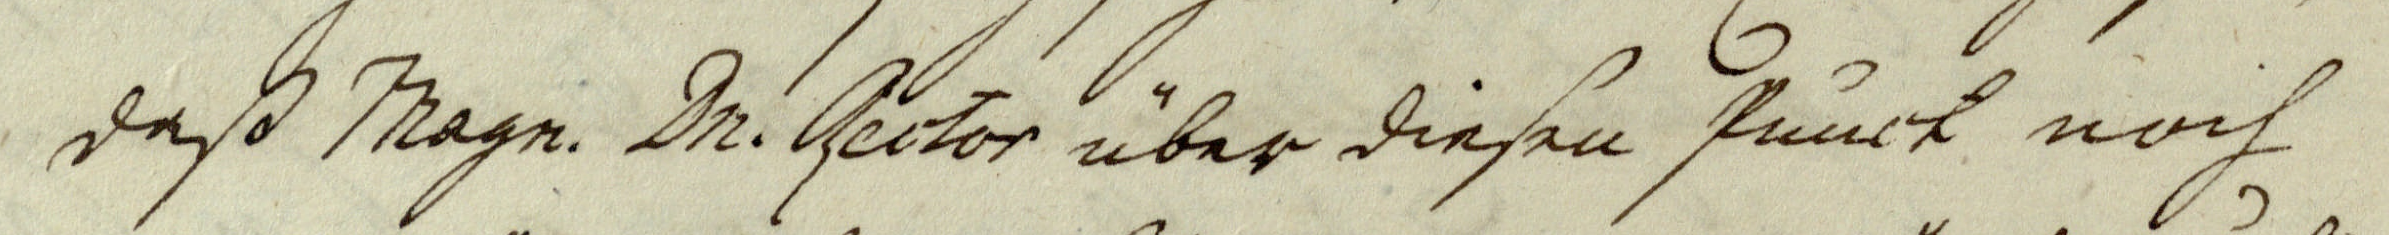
daß Magn. Dn. Rector über diesen Punct noch
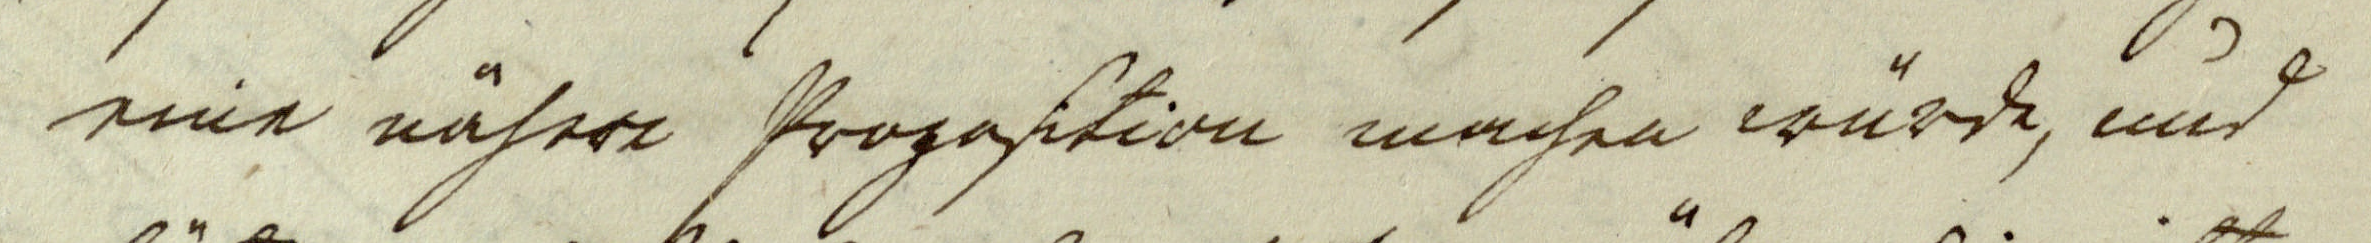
eine nähere Proposition machen würde, und
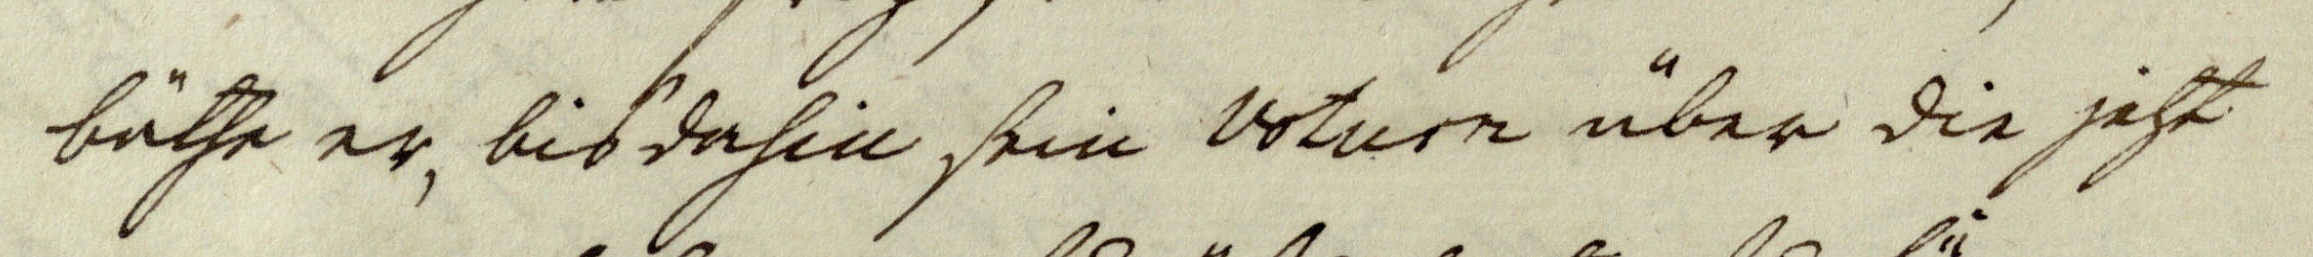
bäthe er, bis dahin sein votum über die jetzt
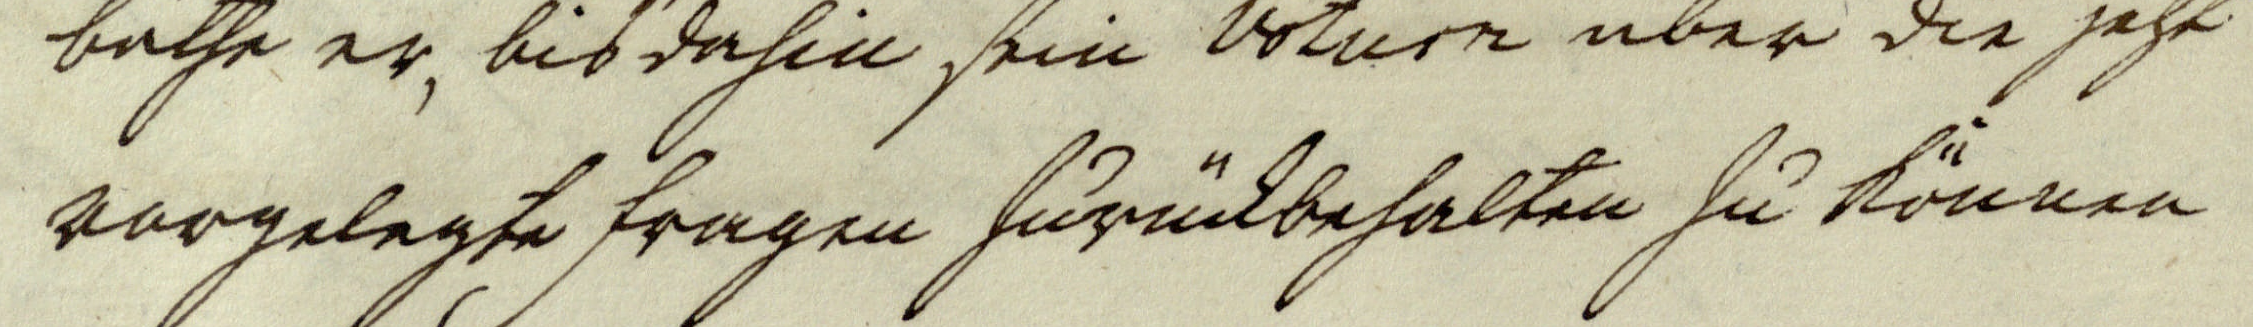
vorgelegte Fragen zurückbehalten zu können.
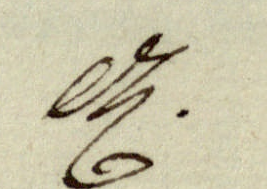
dh.
